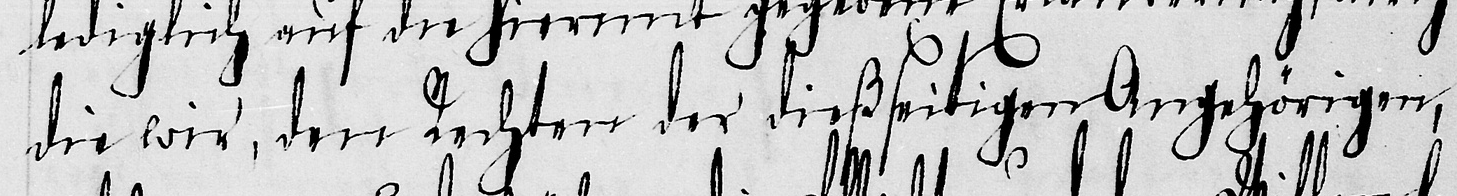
die wir, den Rechten der dießseitigen Angehörigen,
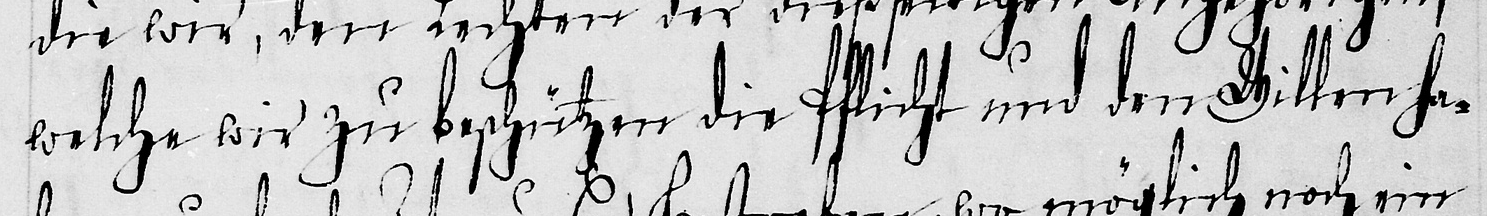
welche wir zu beschützen die Pflicht und den Willen ha¬
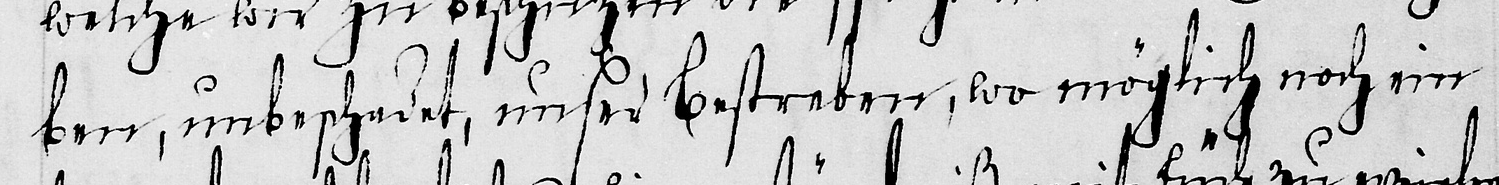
ben, unbeschadet, unser Bestreben, wo möglich noch ein
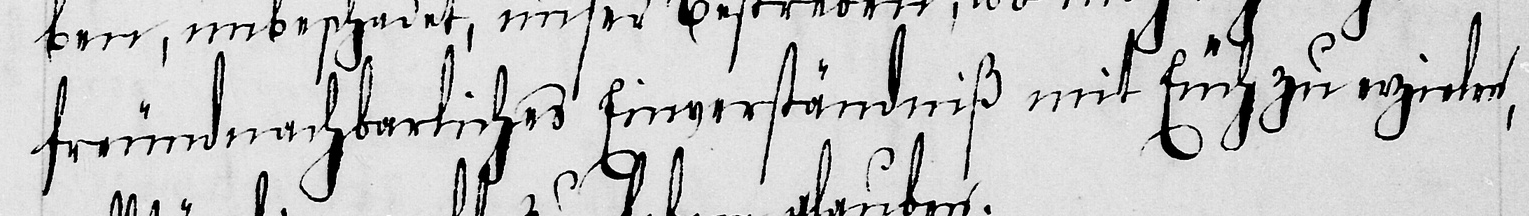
freundnachbarliches Einverständniß mit Euch erzielen,
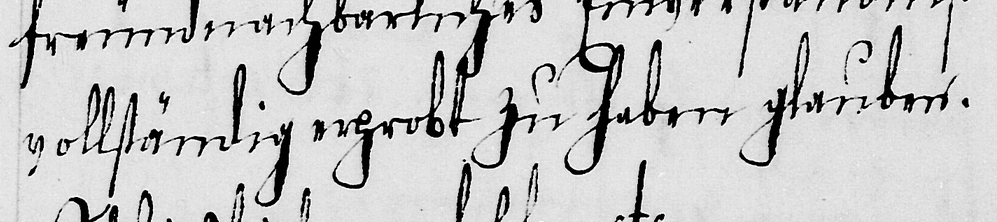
vollständig erprobt zu haben glauben.
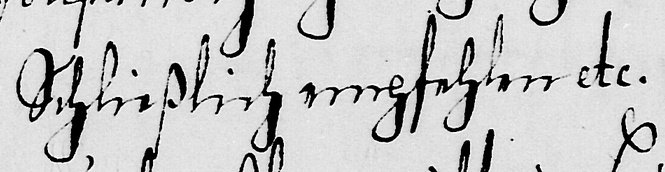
Schließlich empfehlen etc.
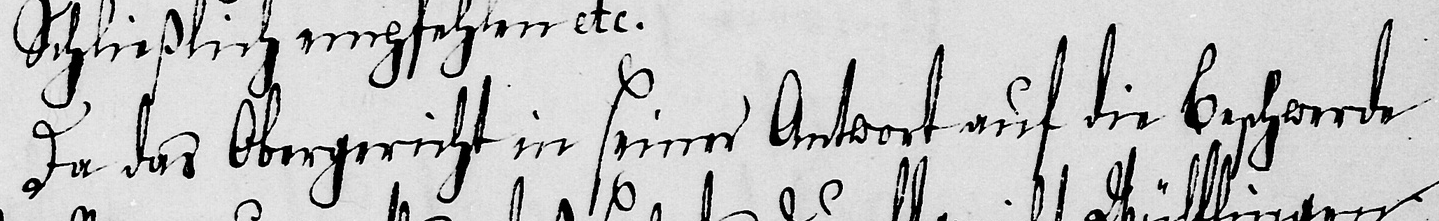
Da das Obergericht in seiner Antwort auf die Beschwerde
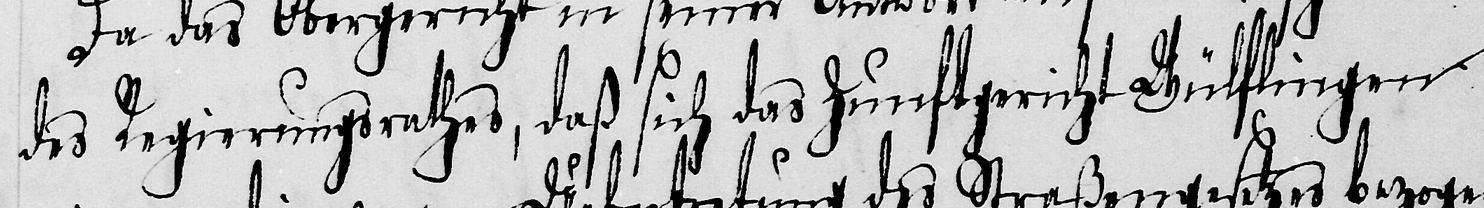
des Regierungsrathes, daß sich das Zunftgericht Wülflingen
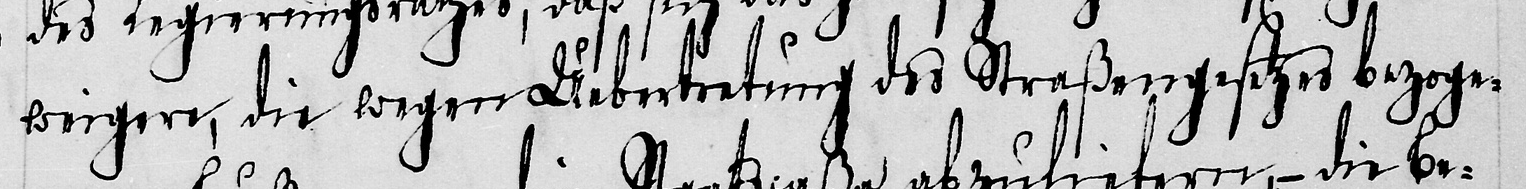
weigere, die wegen Uebertretung des Straßengesetzes bezoge¬
